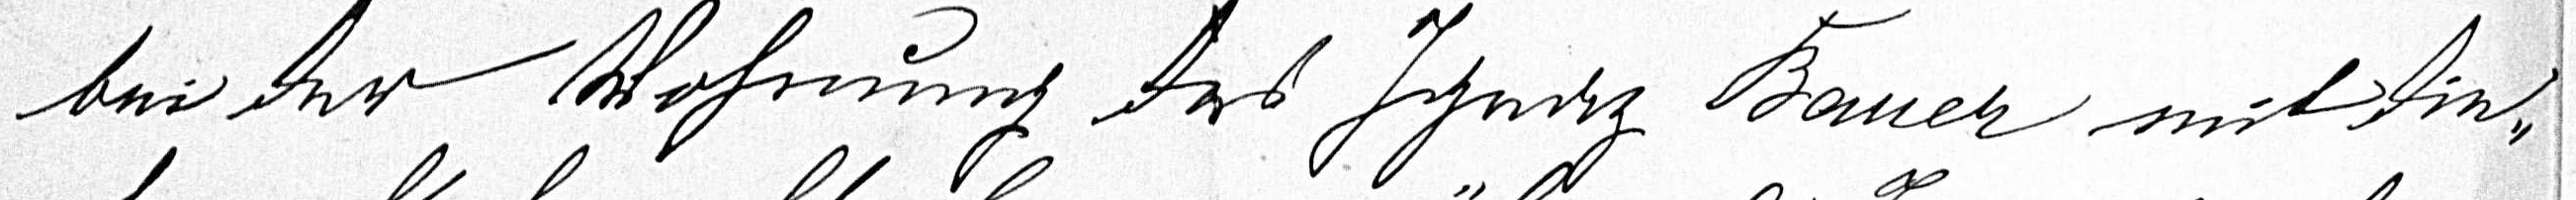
bei der Wohnung des Ignaz Bauer mit die¬
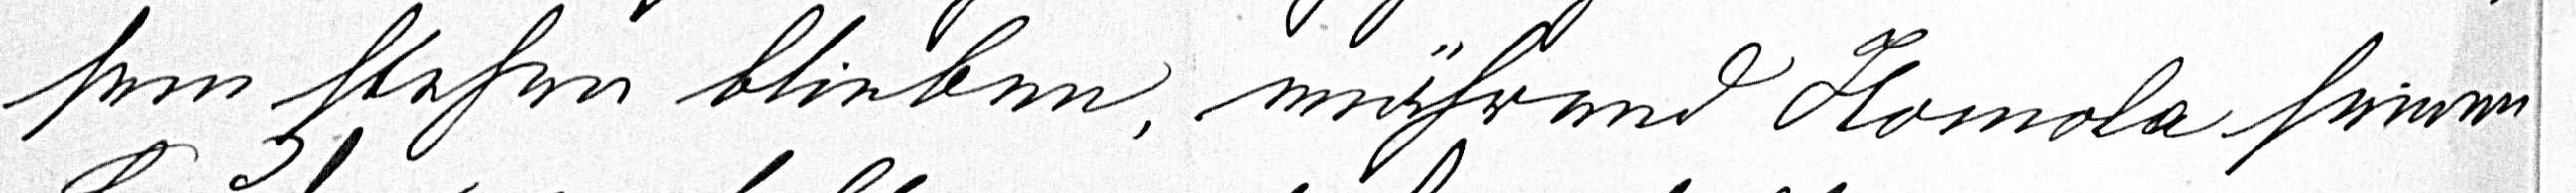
sem stehen blieben, während Homola seinem
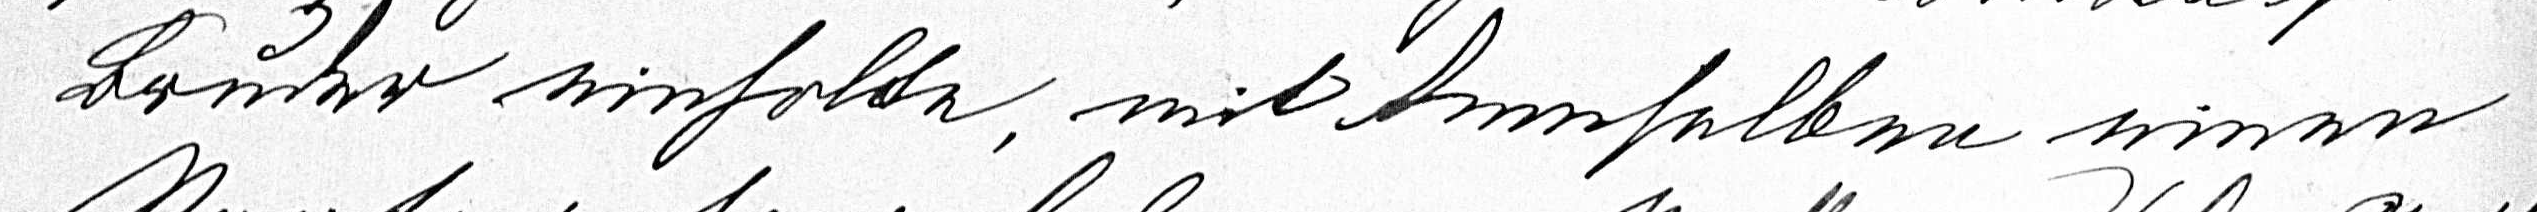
Bruder einholte, mit demselben einen
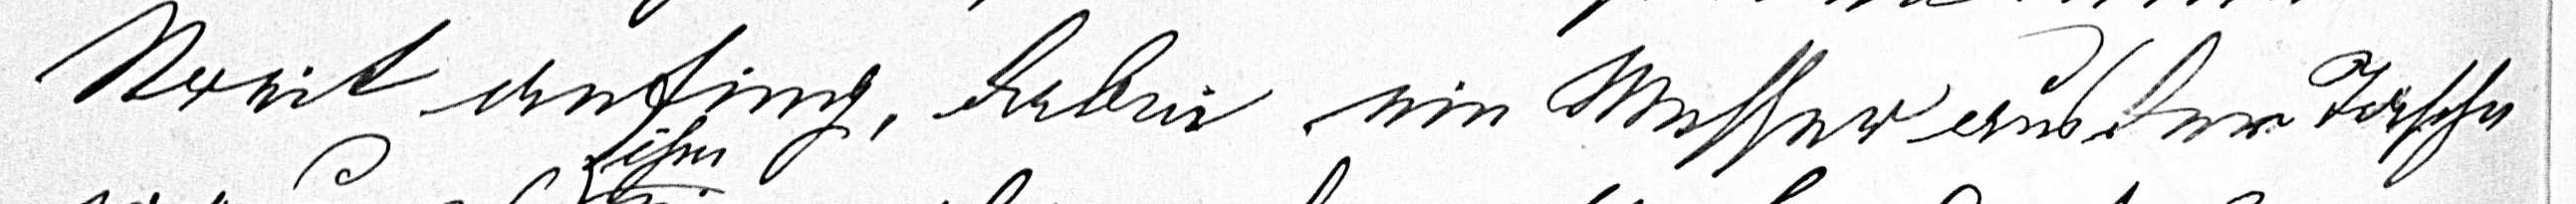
Streit anfing, dabei ein Messer aus der Tasche
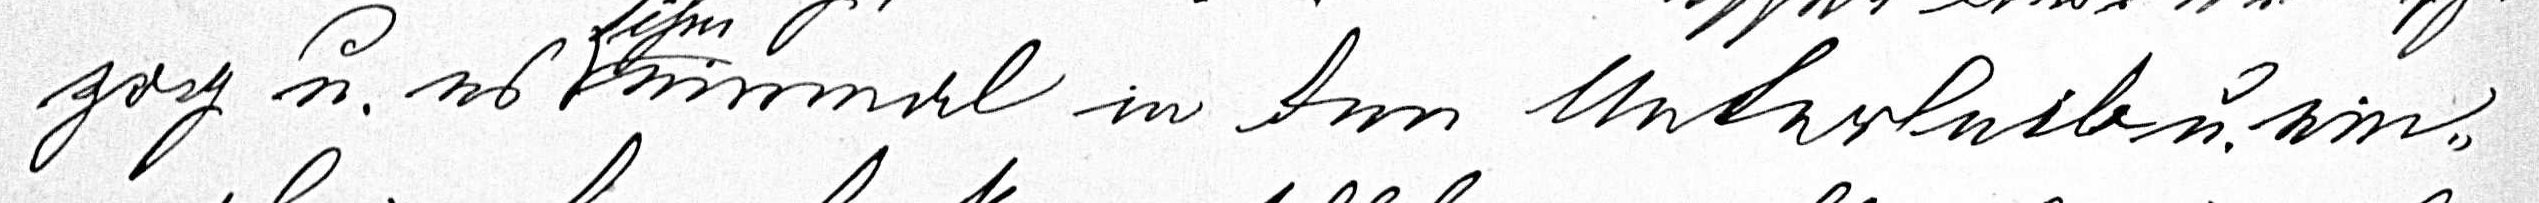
zog u. es ihm einmal in den Unterleib u. ein¬
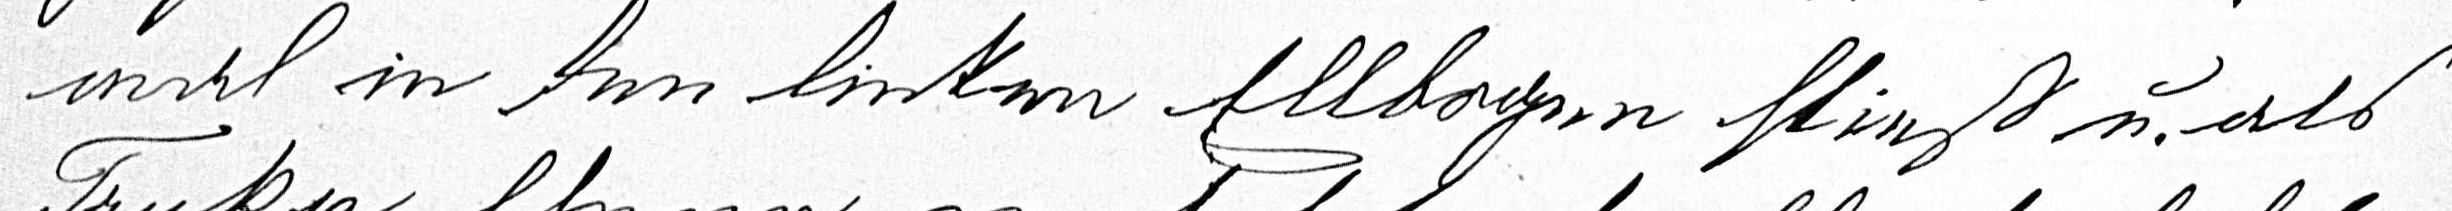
mal in den linken Ellbogen stießt u. als
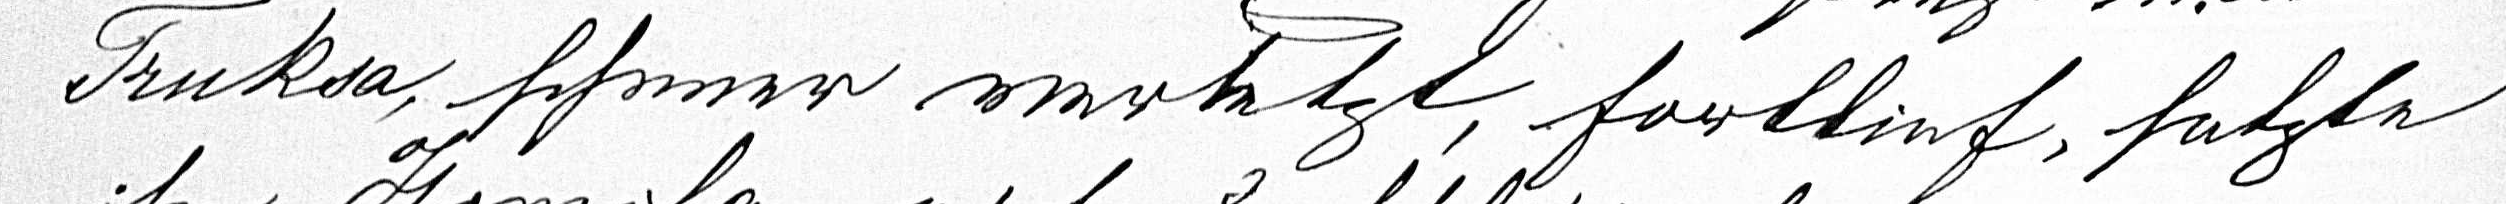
Truksa, schwer verletzt, fortlief, folgte
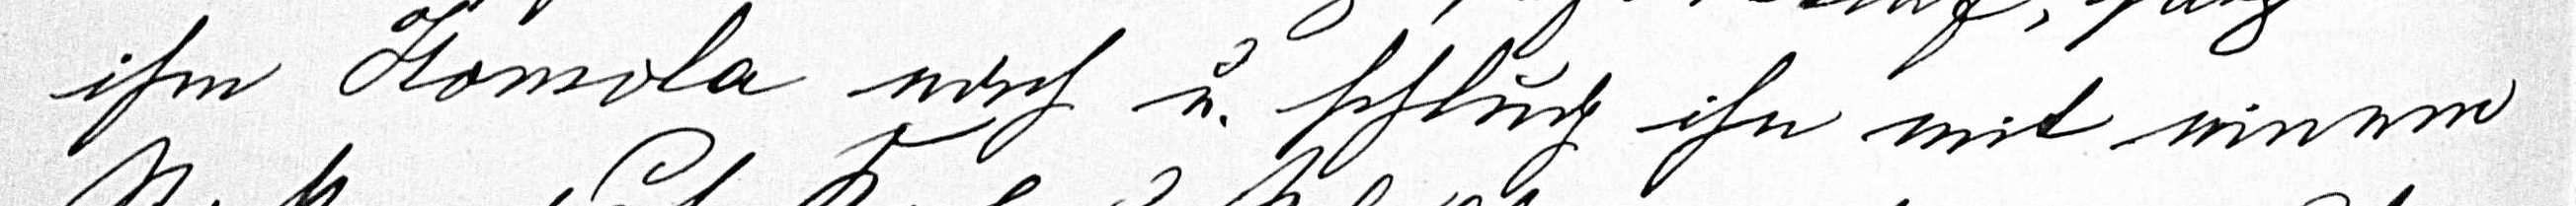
im Homola nach u schlug ihn mit einem
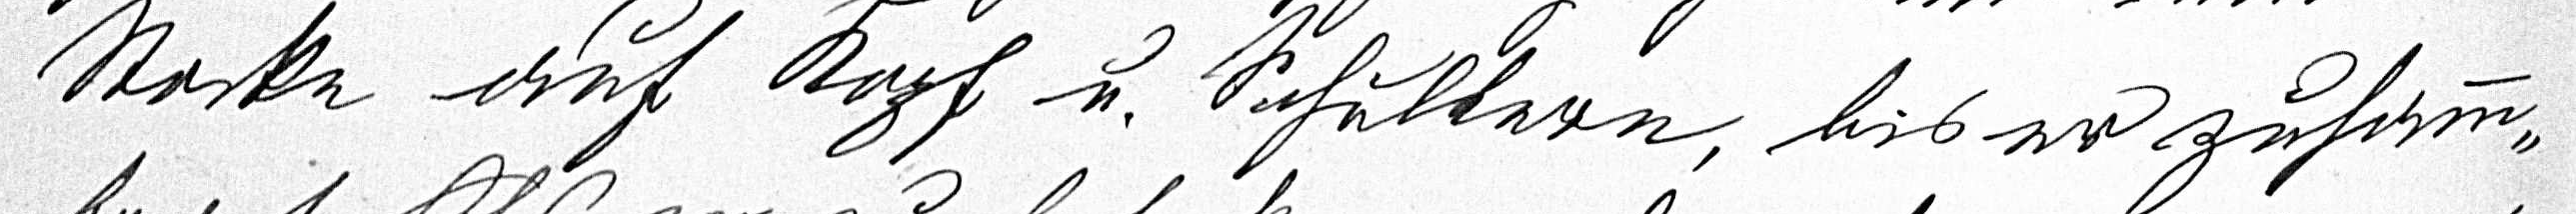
Stocke auf Kopf u. Schultern, bis er zusam¬
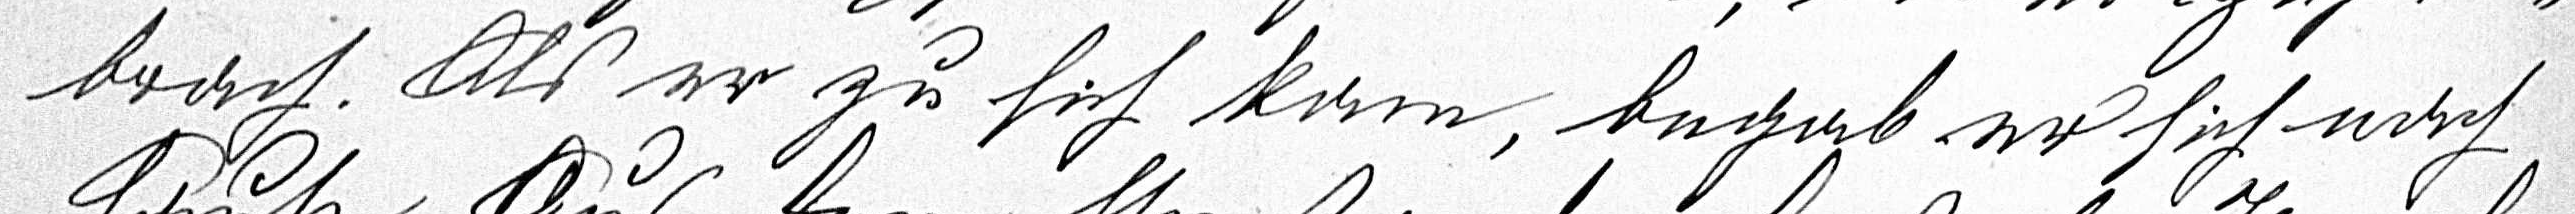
menbrach. Als er zu sich kam, begab er sich nach
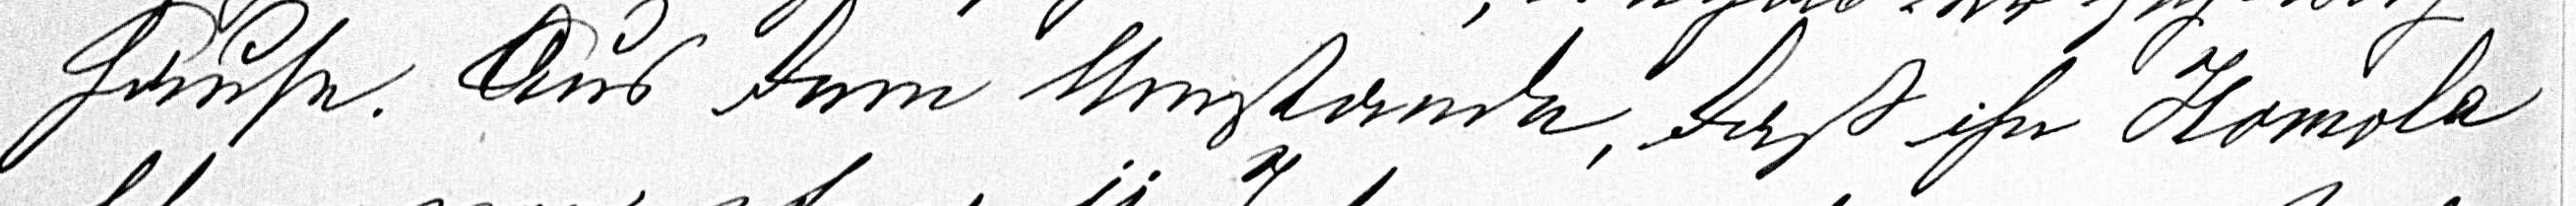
Hause. Aus dem Umstande, daß ihn Homola
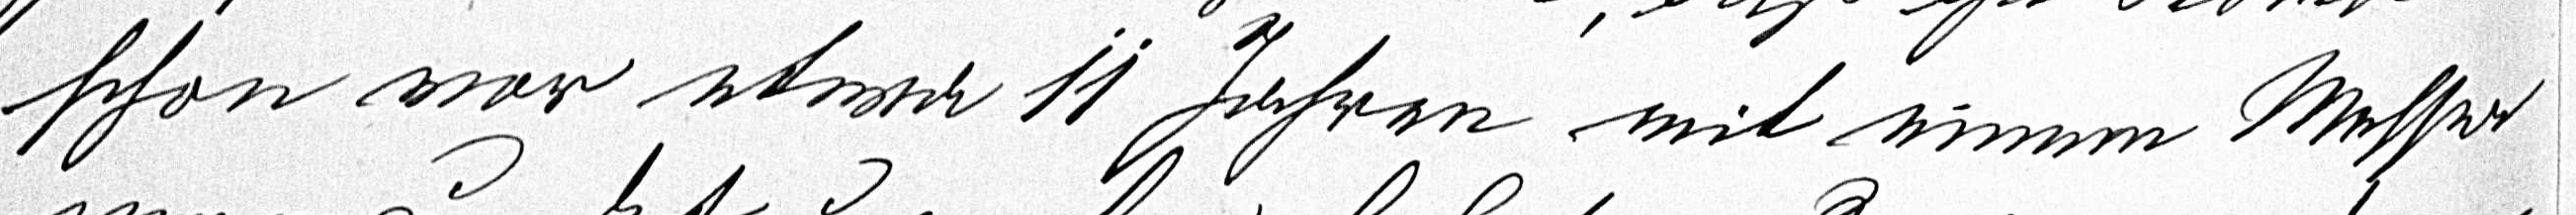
schon vor etwa 11 Jahren mit einem Messer
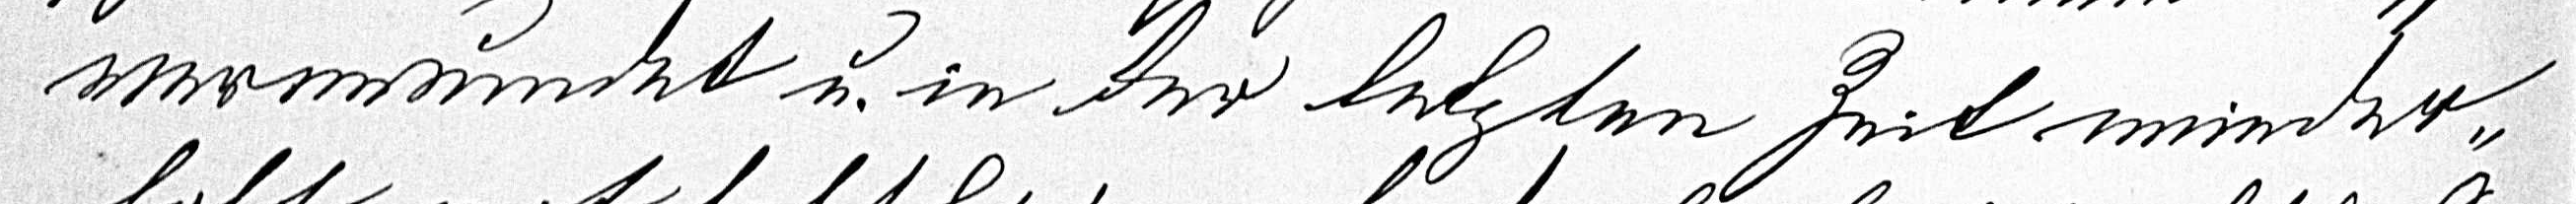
verwundet u. in der letzten Zeit wieder¬
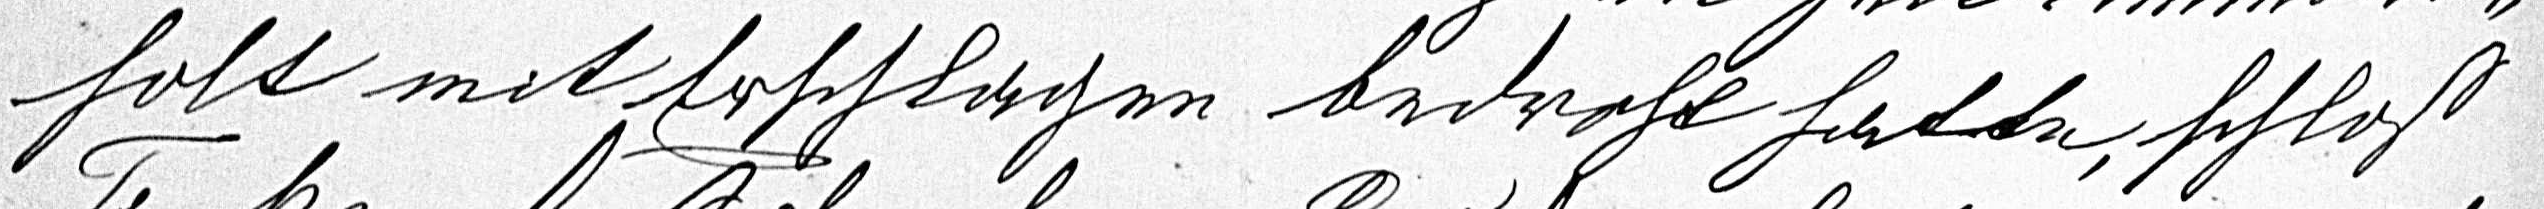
holt mit Erschlagen bedroht hatte, schloß
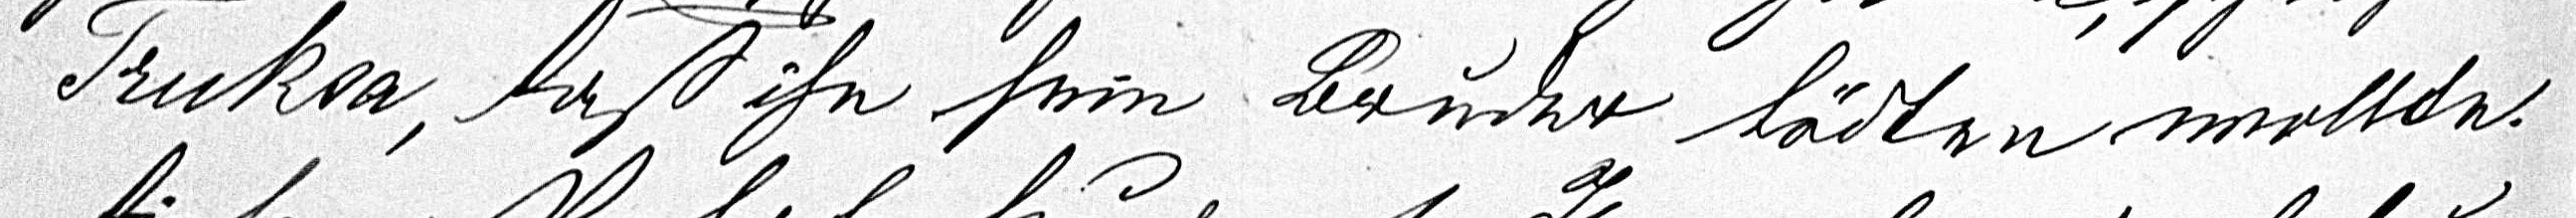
Truksa, daß ihn sein Bruder tödten wollte.
